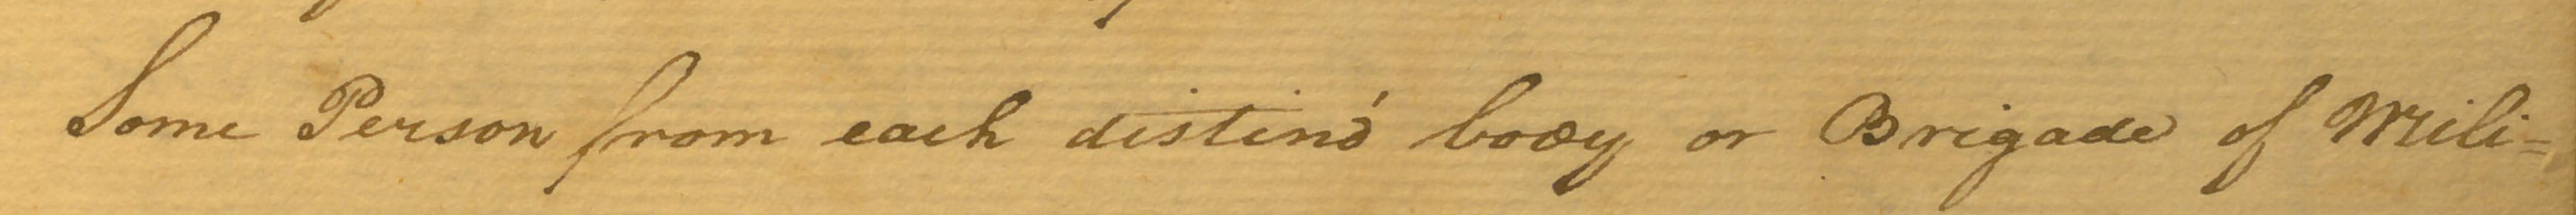Some Person from each distin'd body or Brigade of Mili-
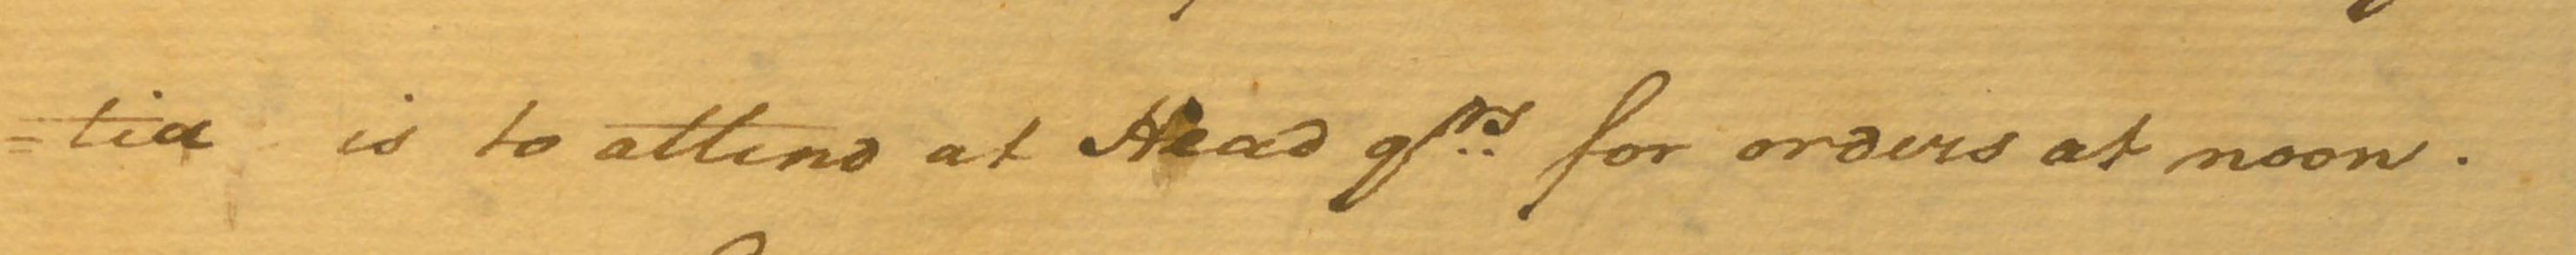-tia is to attend at Head q^rs. for orders at noon.
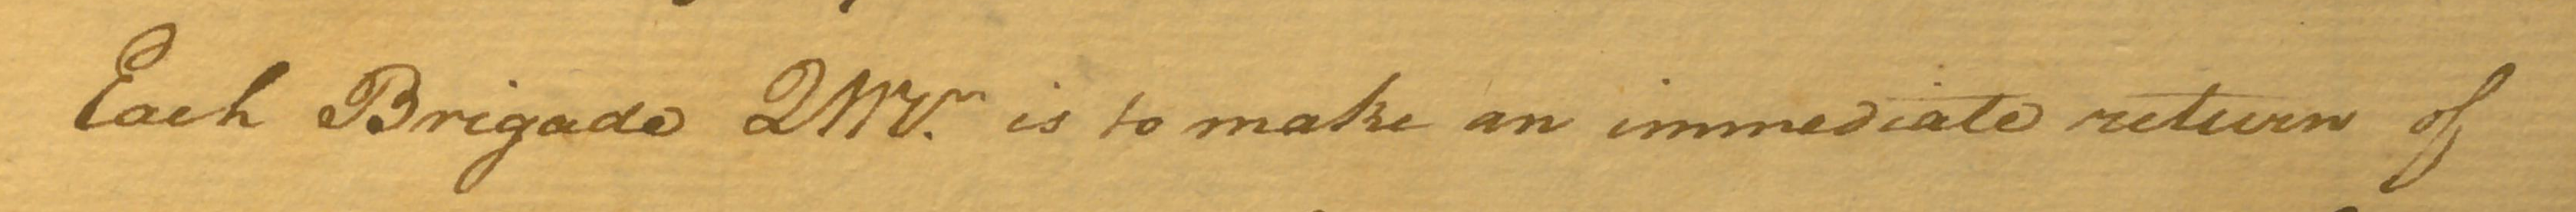Each Brigade QM^r. is to make an immediate return of
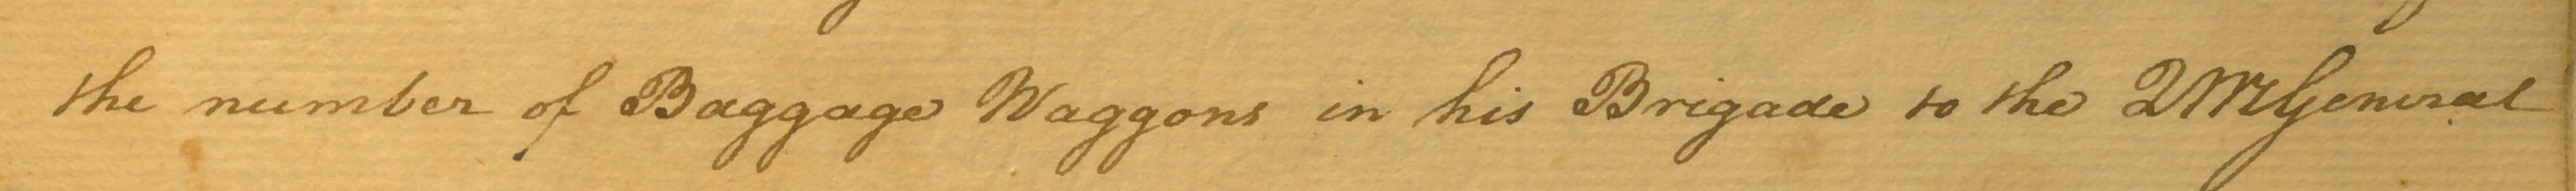the number of Baggage Waggons in his Brigade to the QMGeneral
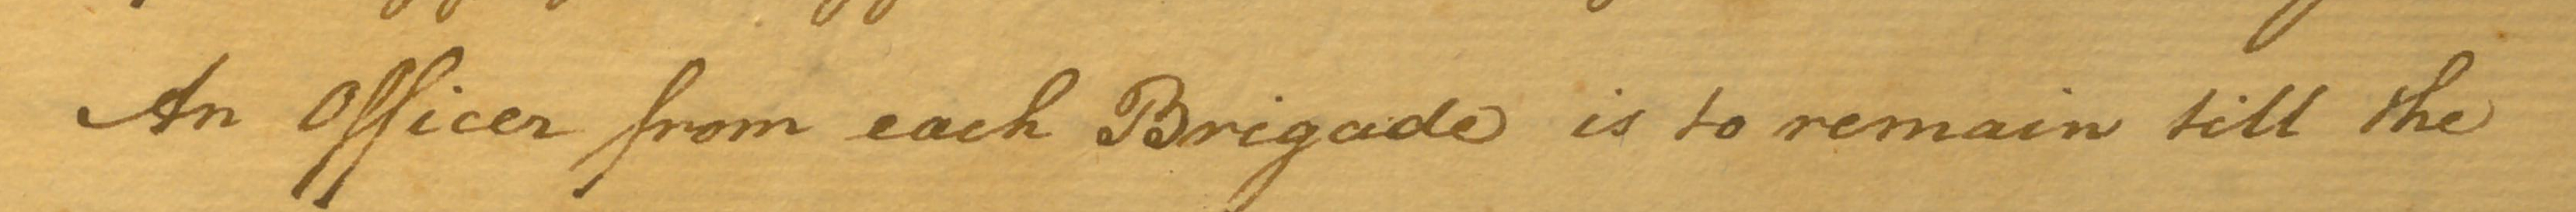An Officer from each Brigade is to remain till the
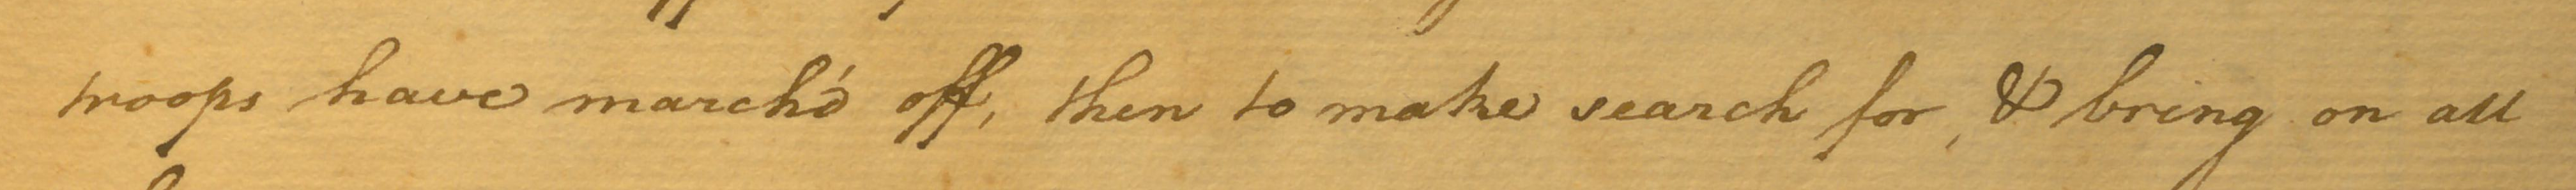troops have march'd off, then to make search for, & bring on all
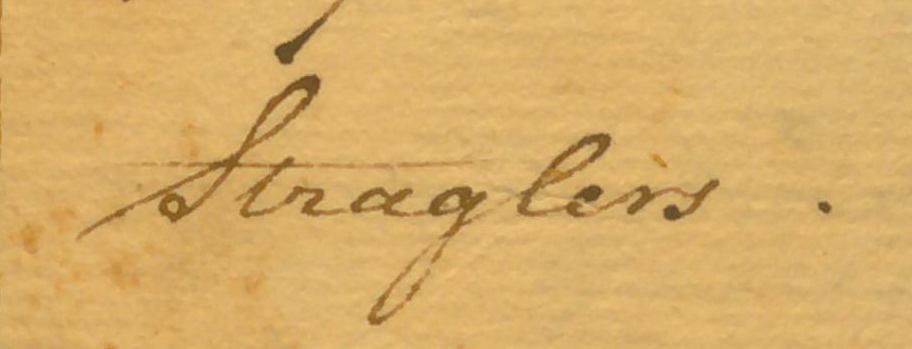Straglers.
